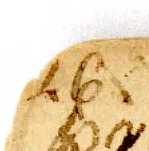26
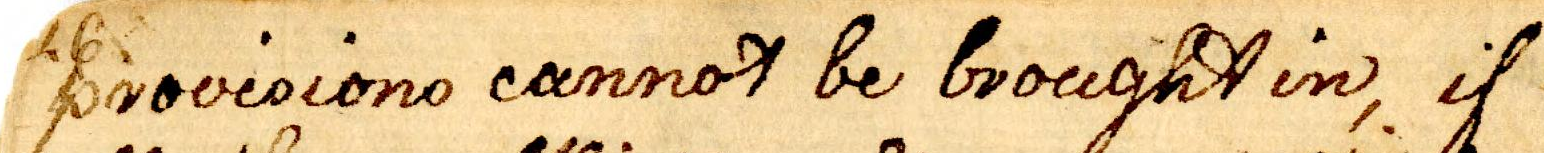provisions cannot be brought in, if
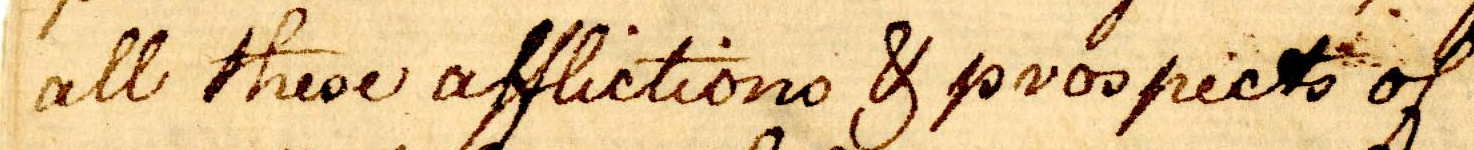all these afflictions & prospects of
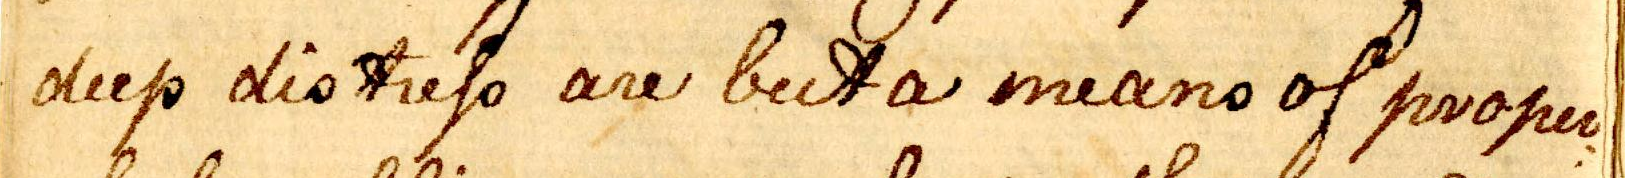deep distress are but a means of proper
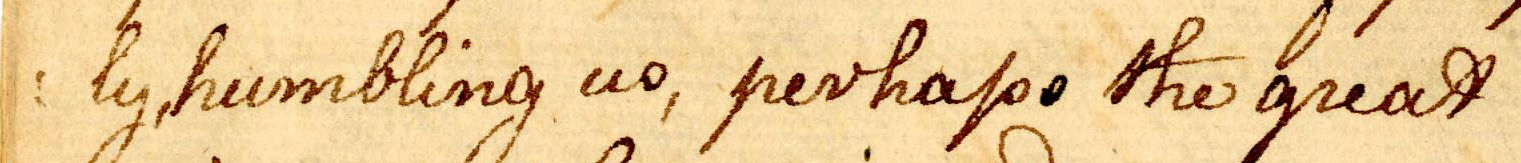-ly humbling us, perhaps the great
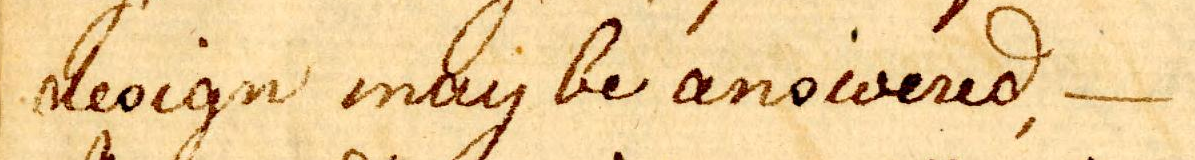design may be answered-
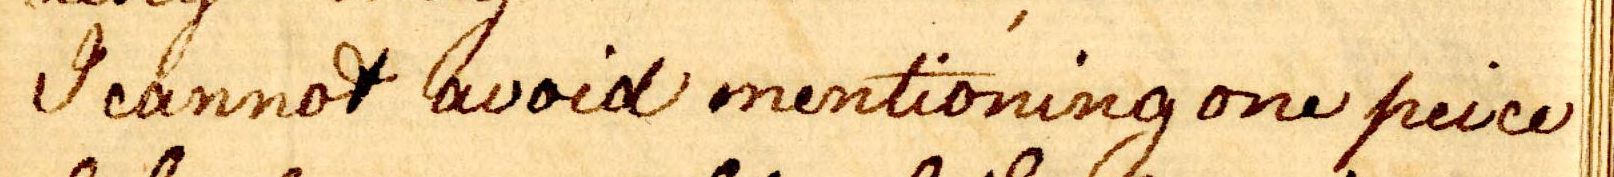I cannot avoid mentioning one peice
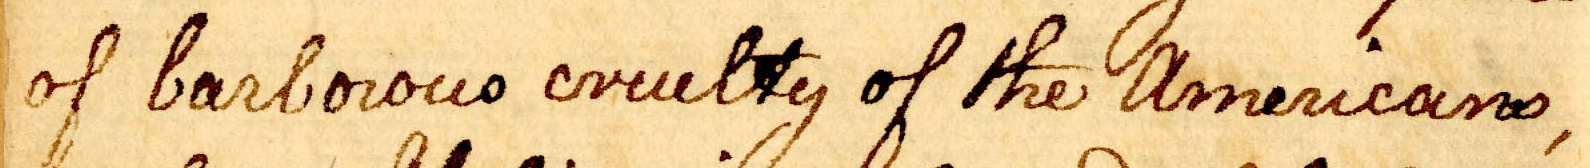of barborous cruelty of the Americans,
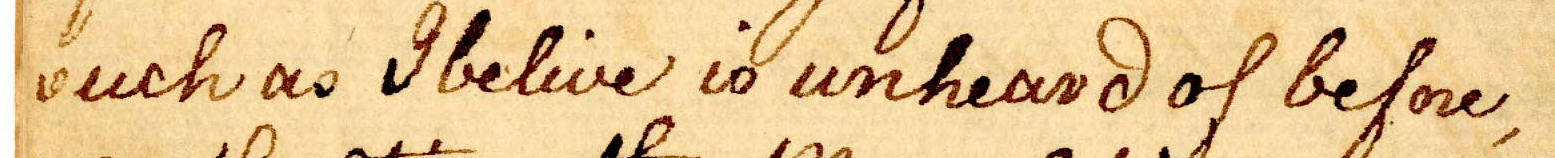such as I belive is unheard of before,
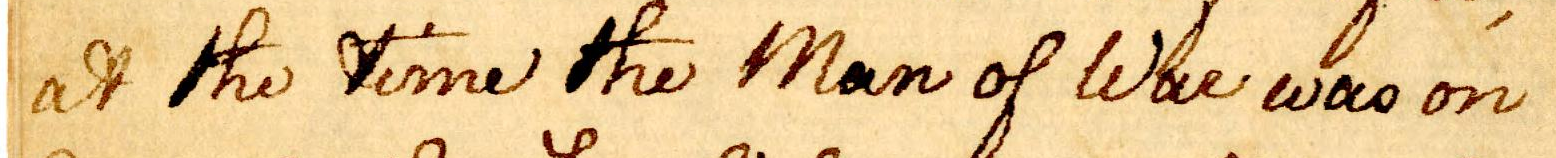at the time the Man of War was on
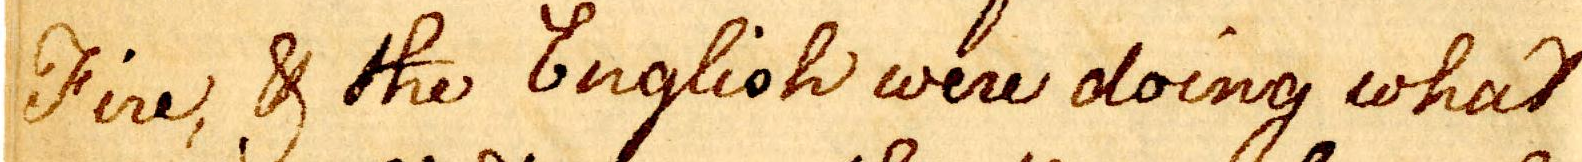Fire, & the English were doing what
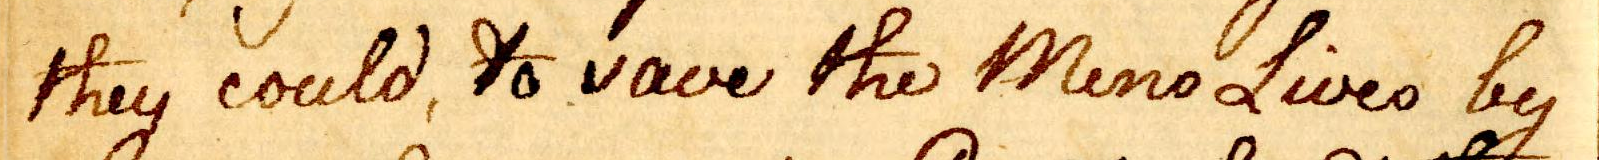they could to save the Mens Lives by
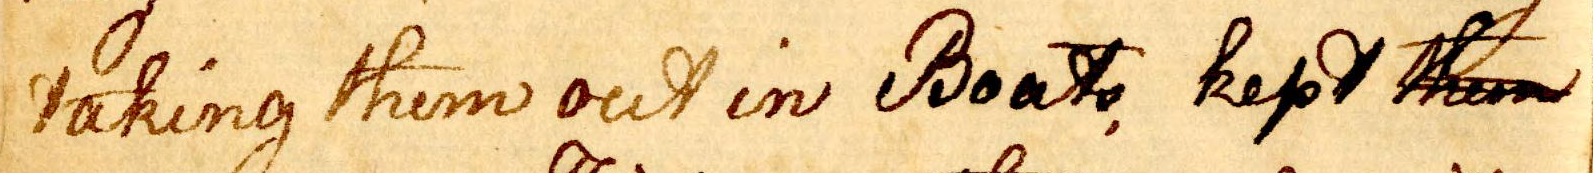taking them out in Boats, kept them
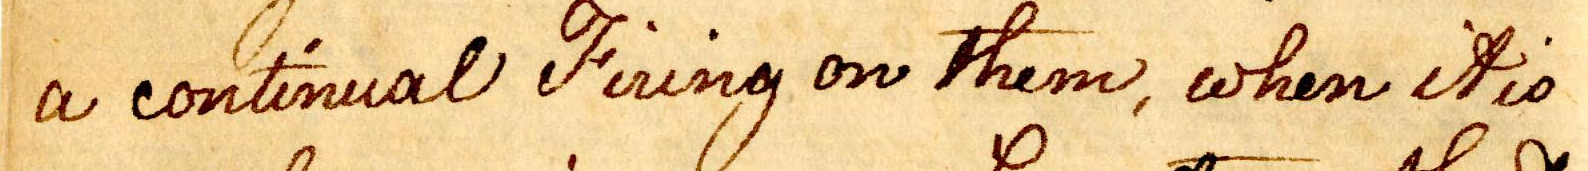a continual Firing on them, when it is
